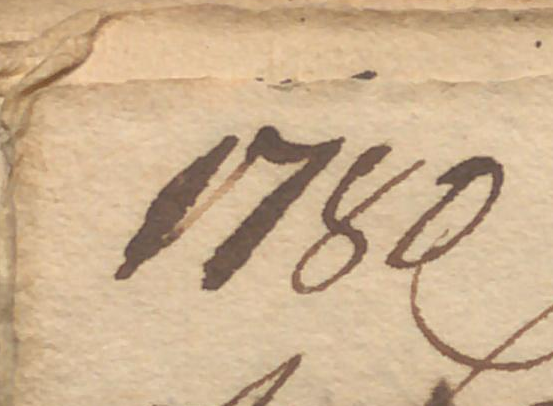1780
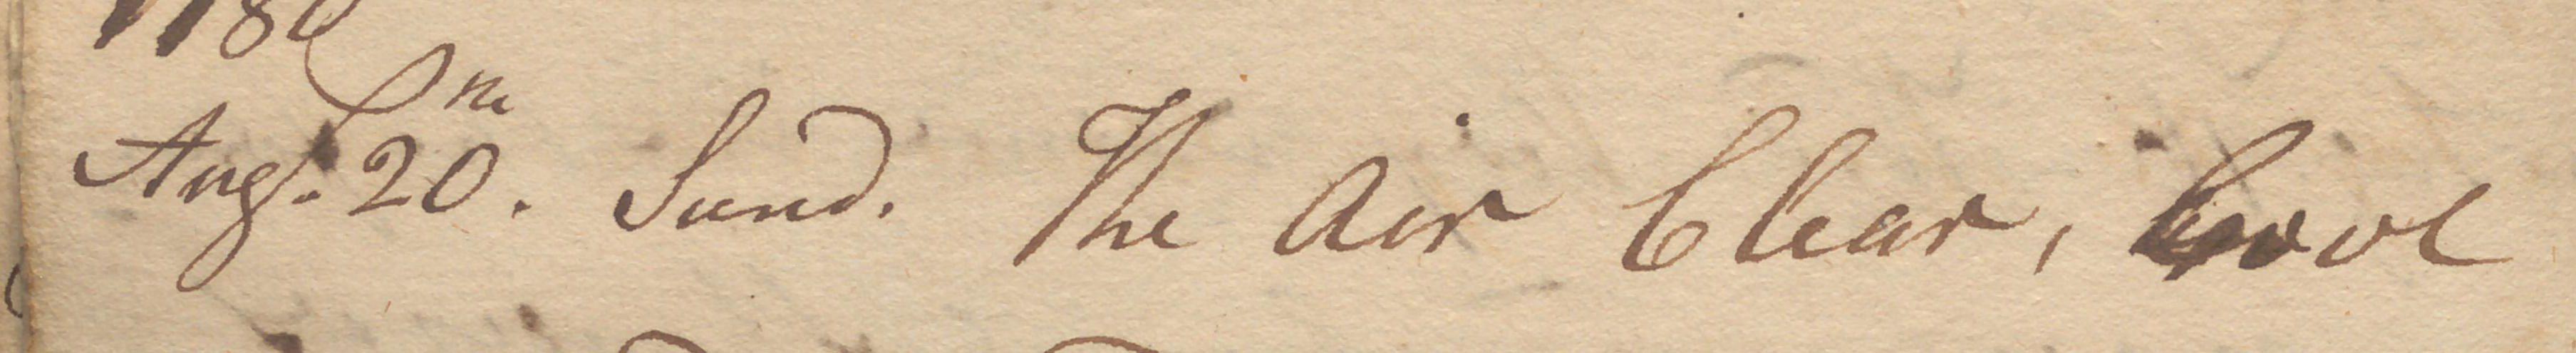Aug^t. 20^th. Sund. The Air Clear, Cool
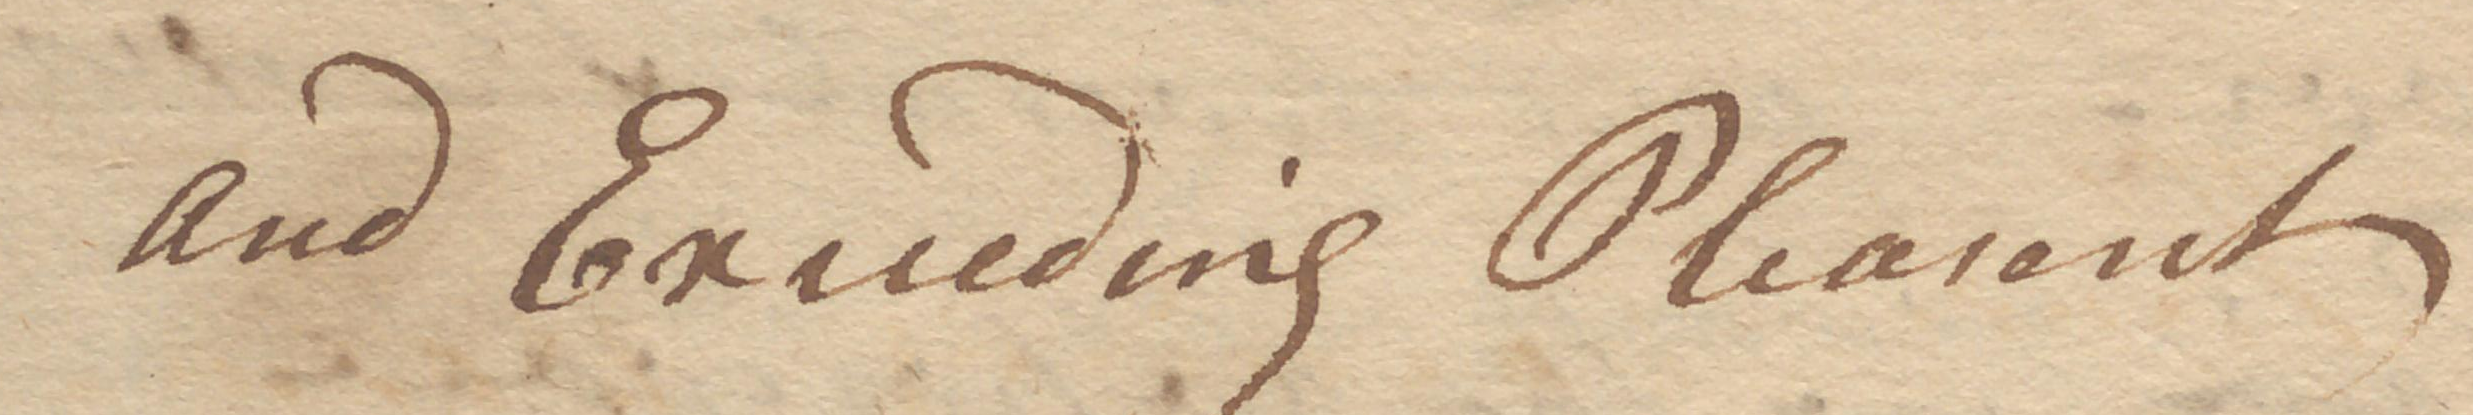and Exceeding Pleasent
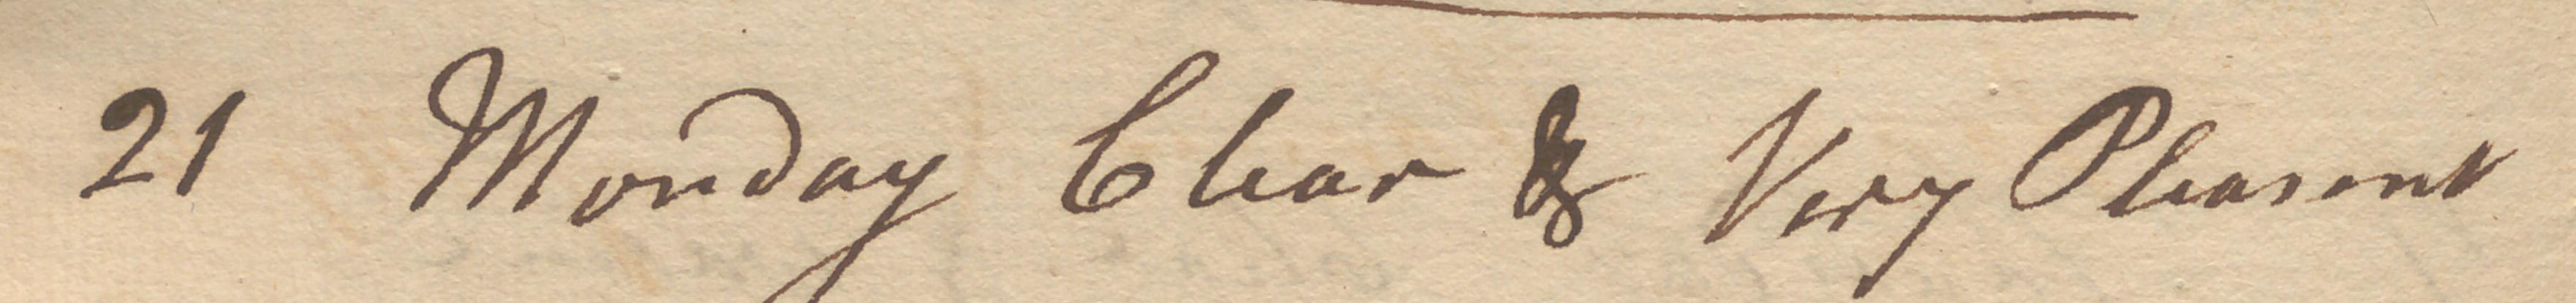21 Monday Clear & Very Pleasent
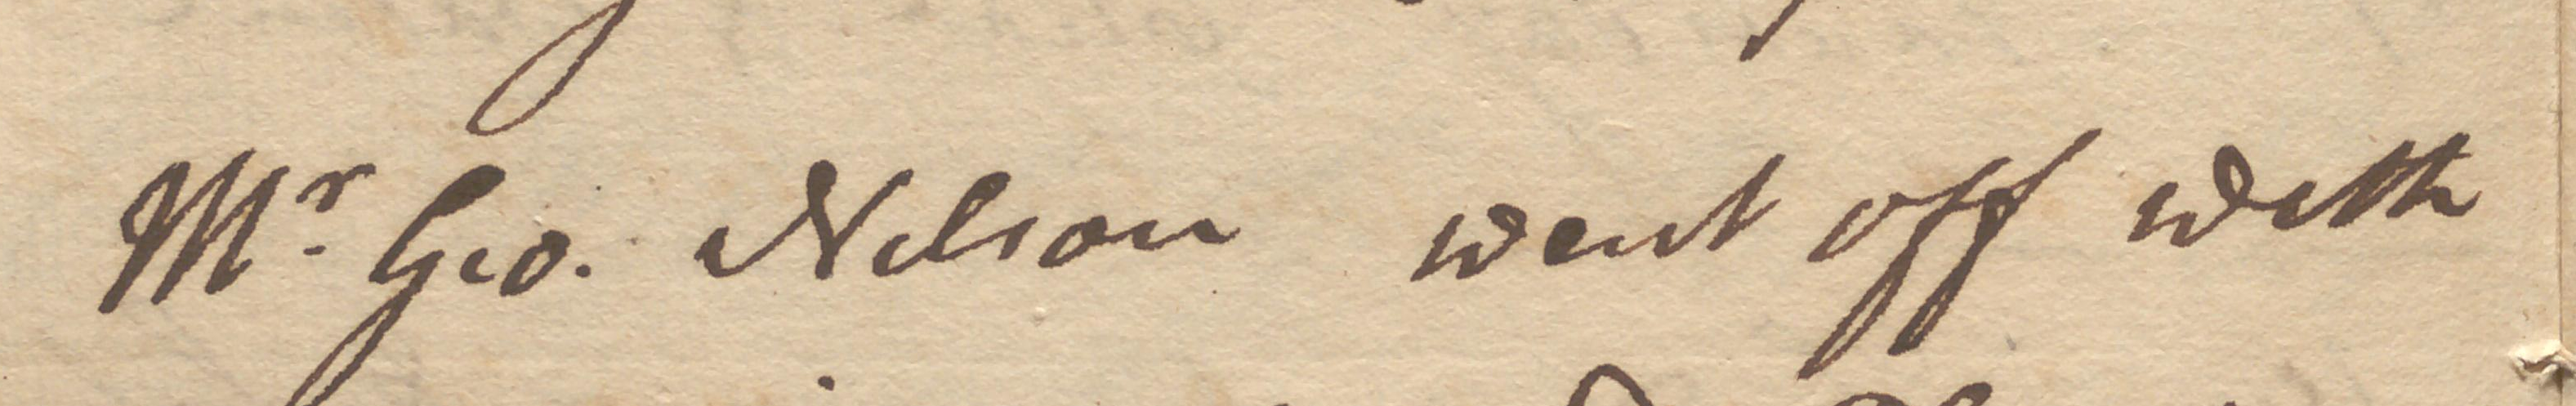M^r. Geo. Nelson went off with
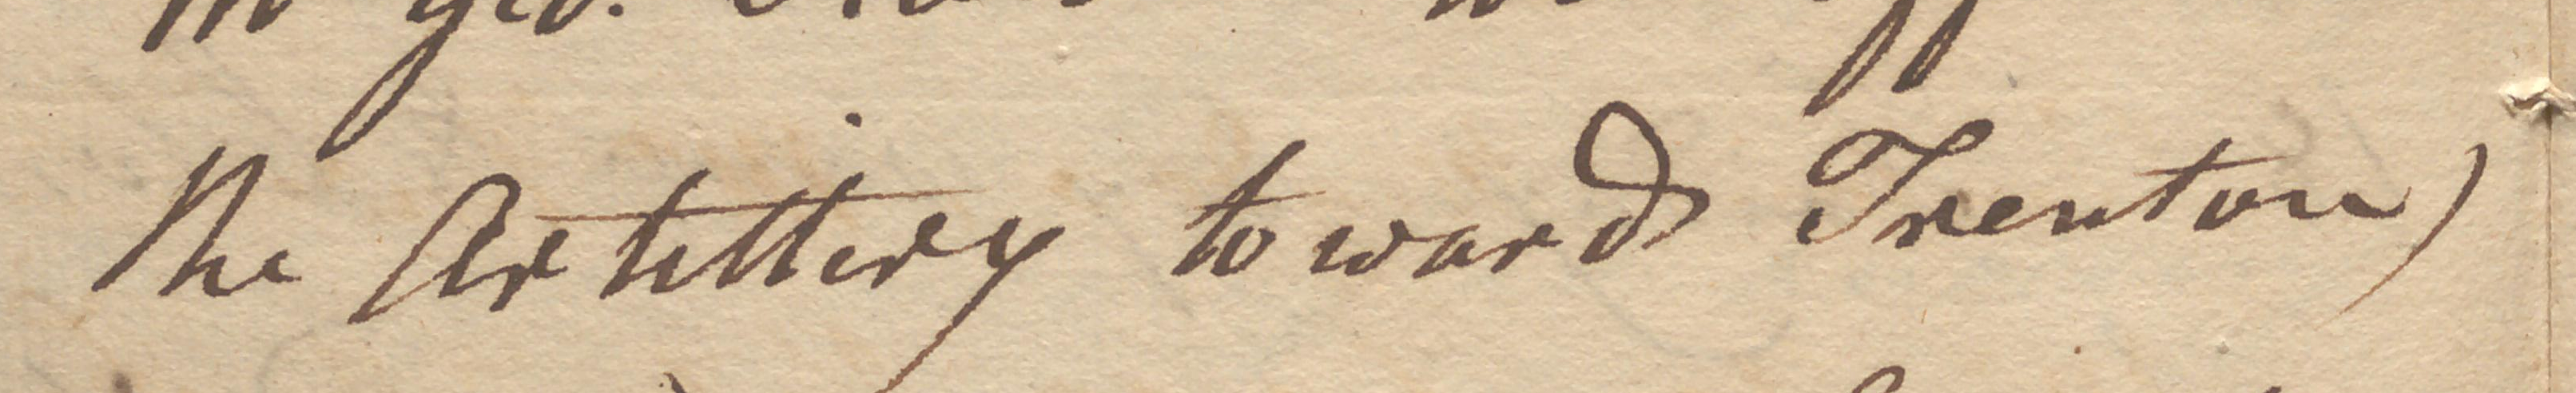the Artillery towards Trenton
